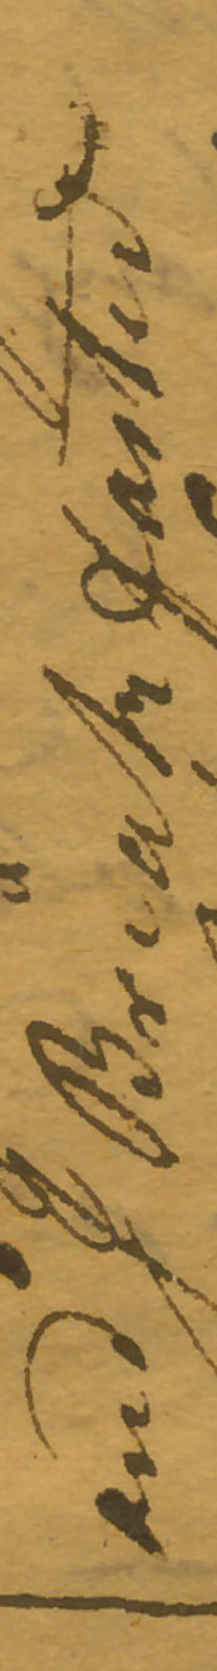and I Breakfasted
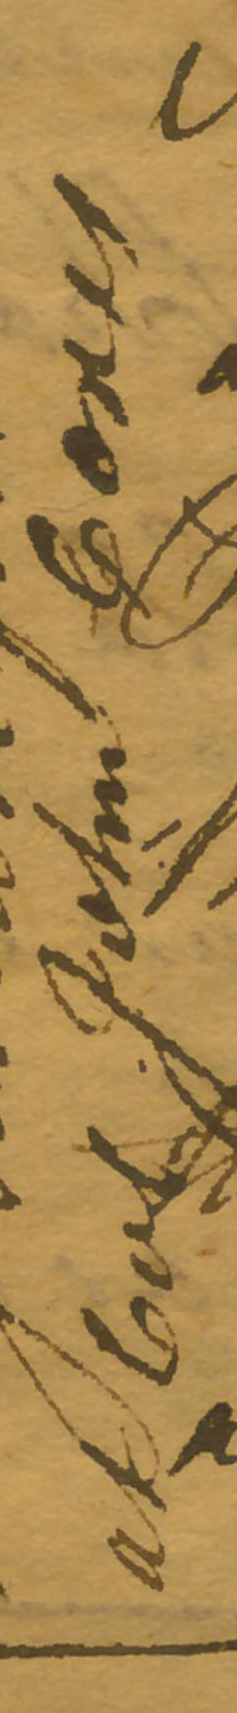at Col John Cones
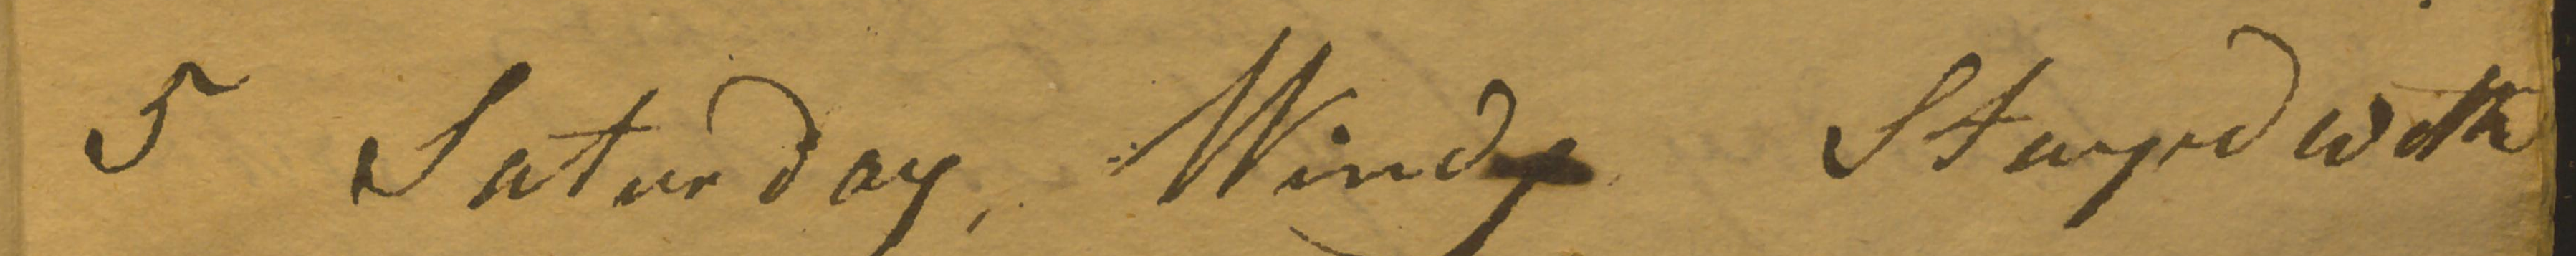5 Saturday Windy Stayed with
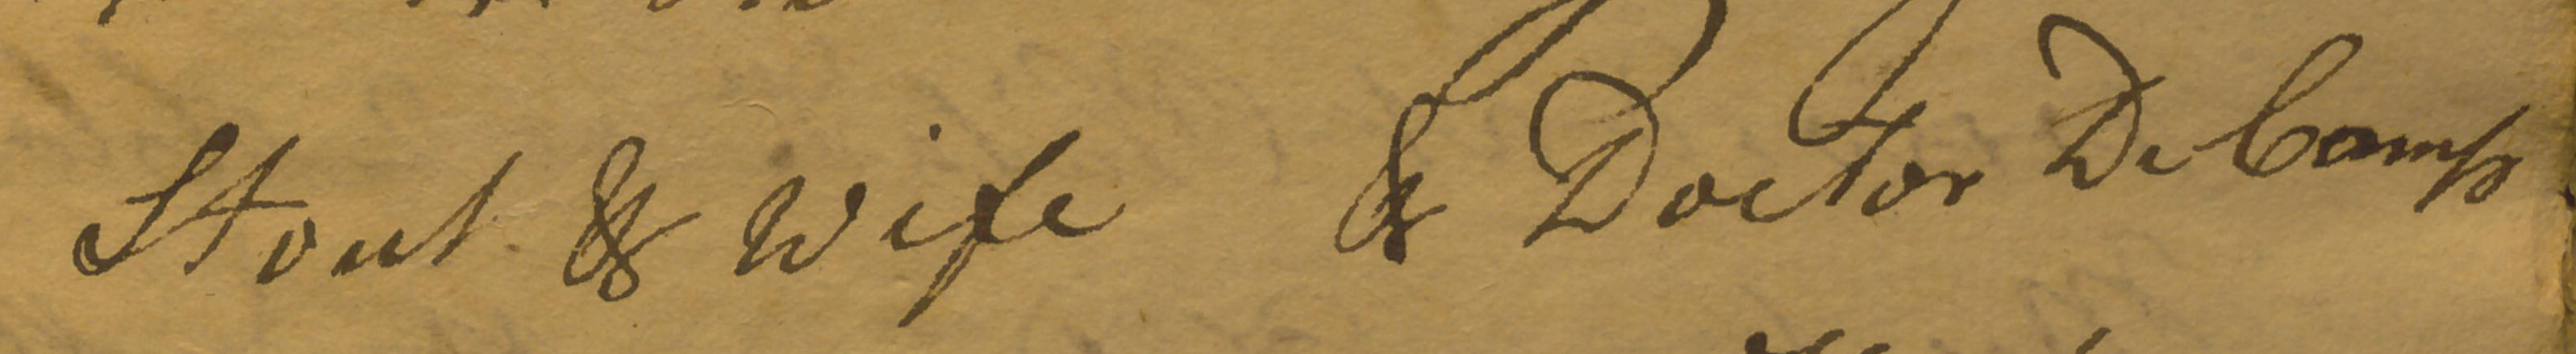Stout & wife & Doctor DeCamp
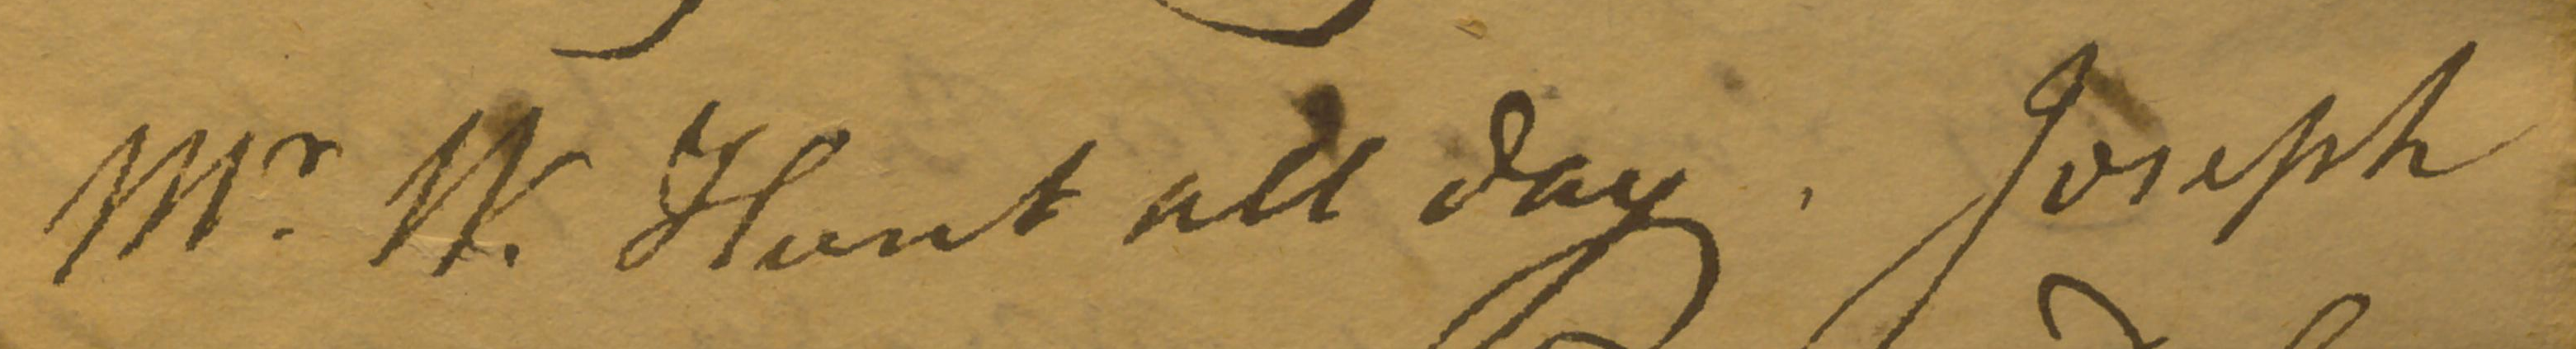M^r. W. Hunt all day. Joseph
